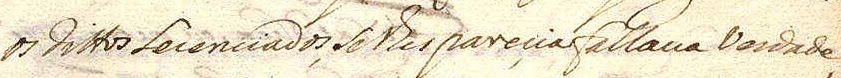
os dittos Lecenciados, se lhes pareçia fallaua verdade,
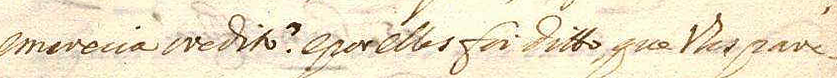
e merecia credito? E por elles foi ditto, que lhes pare
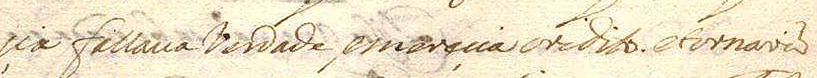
çia fallaua Verdade, e mereçia credito. e tornaraõ
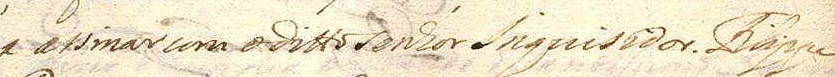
a assinar com o ditto Senhor Inquisidor. Filippe
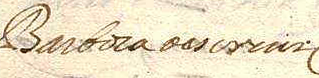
Barboza o escreui
